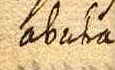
a bula
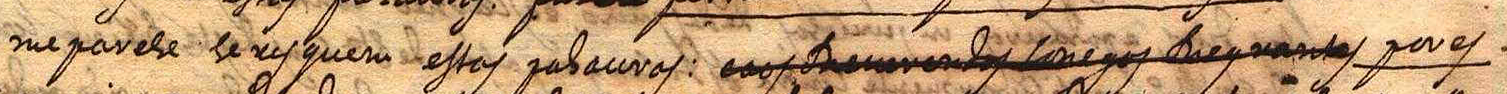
me parese se risquem estas palauras: e aos Reuerendos Conegos Regrantes por es
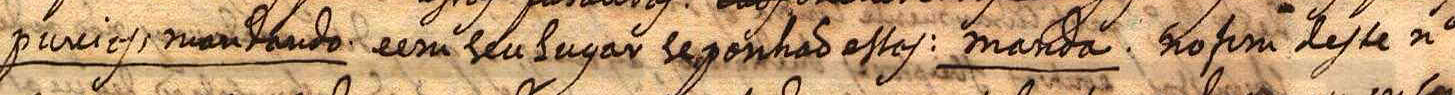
purios mandando e em seu lugar se ponhaõ estas: manda no fim deste no
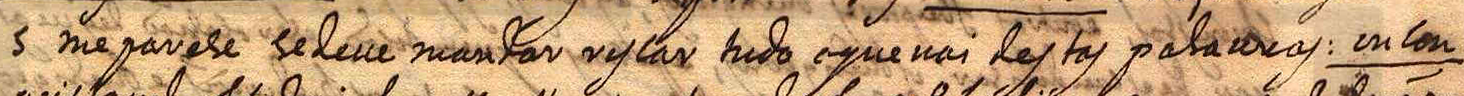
5 me parese se deue mandar riscar tudo a que uai destas palauras: incon
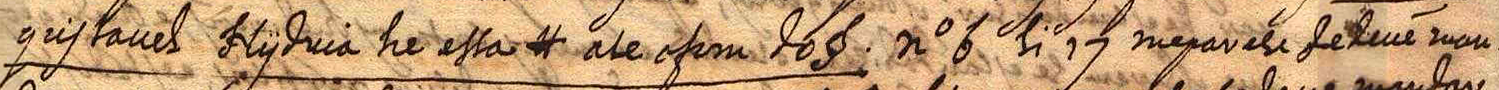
quistauel Hydria he esta tt ate o fim do §. no 6 li 17 me parese se deuē man
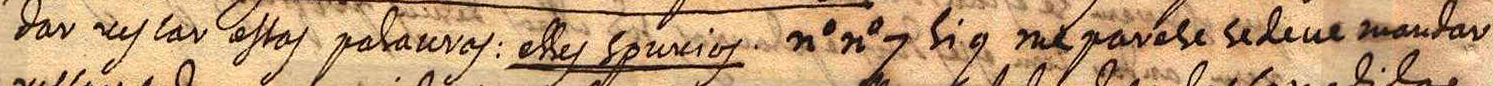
dar riscar estas palauras: elles spurios. no no 7 li 9 me parese se deue mandar
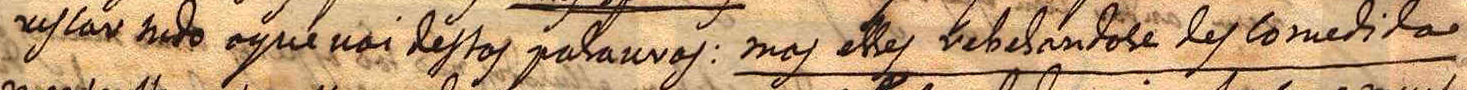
riscar tudo o que uai destas palauras: mas elles rebelandose descomedida
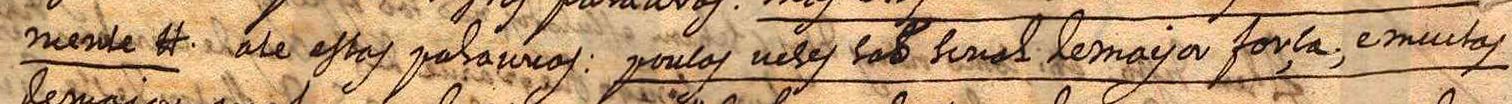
mente tt. ate estas palauras: poucas ueses saõ sinal de mayor força; e muitas
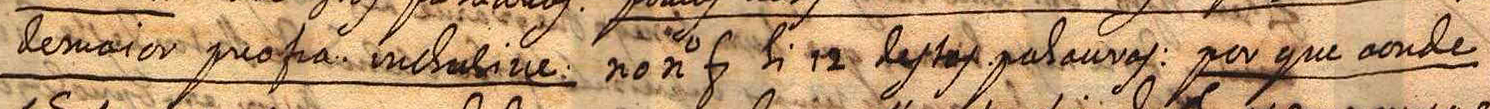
de maior profia inclusiue no no 8 li 12 destas palauras: porque aonde
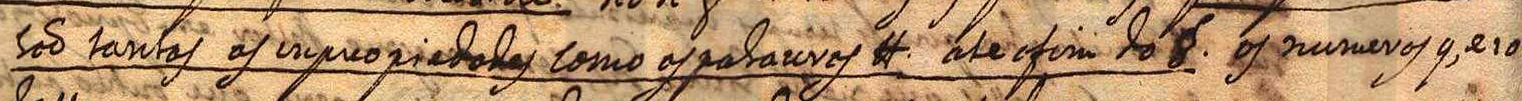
saõ tantas as inpropiedades como as palauras tt. ate o fim do 8. os numeros 9, e 10
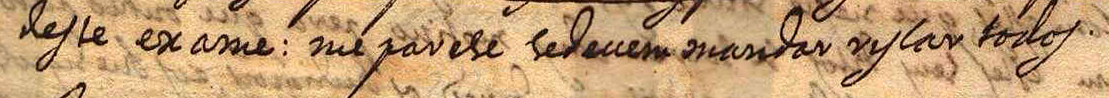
deste exame: me parese se deuem mandar riscar todos.
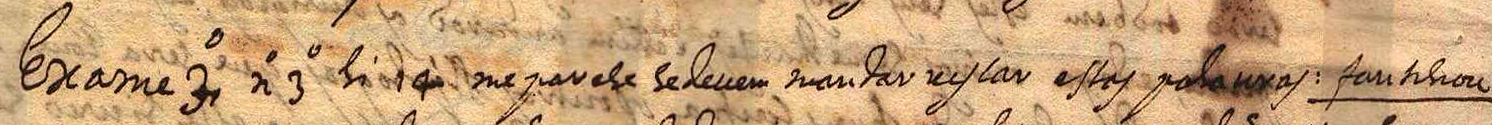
Exame 3o no 3o li 14 me parese se deuem mandar riscar estas palauras: fantisiou
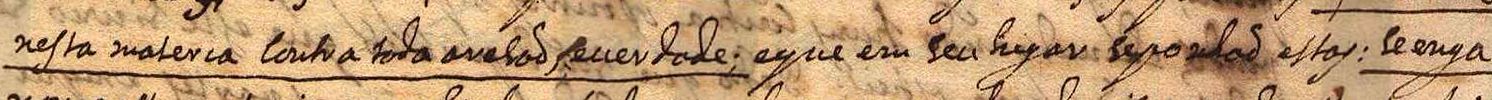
nesta materia contra toda a resaõ, e uerdade; e que em seu lugar se ponhaõ estas: se enga
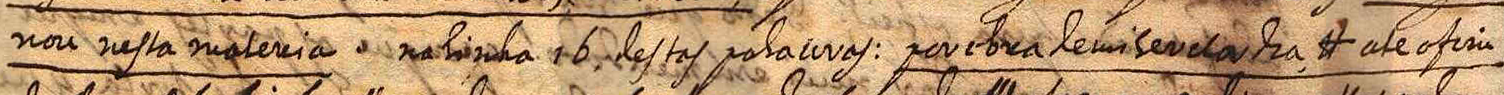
nou nesta materia na linha 16 destas palauras: por obra de misericordia, tt ate o fim
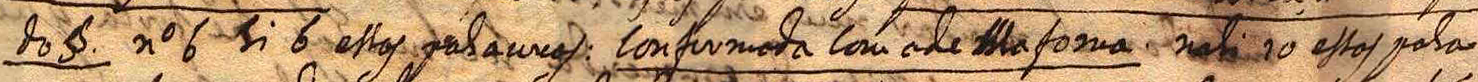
do §. no 6 li 6 estas palauras: confirmada com a de Mafoma na li 10 estas pala
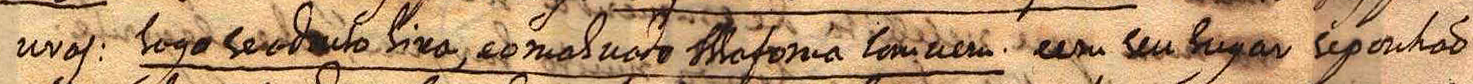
uras: logo se o douto lira, e o maluado Mafoma comuem. e em seu lugar se ponhaõ
